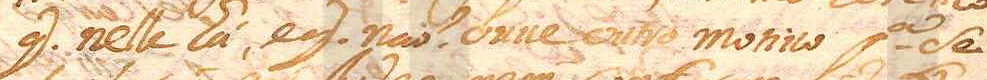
q̄ nelle há, e o q̄ naõ ouue outro motiuo pa se
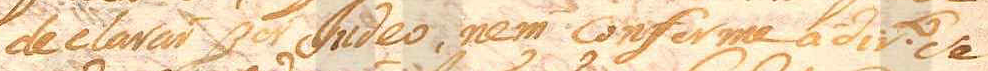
declarar por Judeo, nem conforme a dir.to se
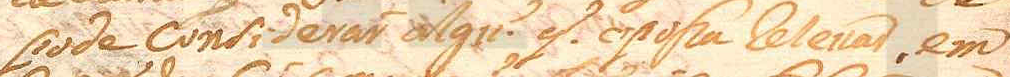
pode considerar algū q̄. o possa Releuar, em
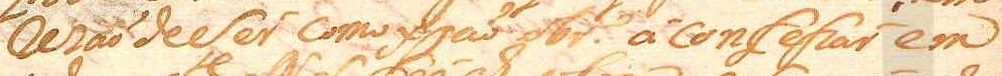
Rezaõ de Ser como xpaõ obr.o á confessar em
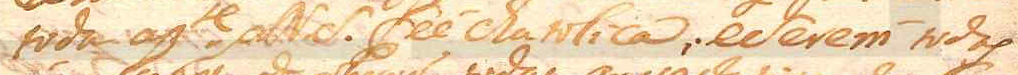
toda a p.te a N. S. feé chatolica; e Serem todas
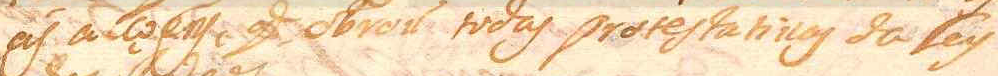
as açoens, q̄ obrou todas protestatiuas da Ley
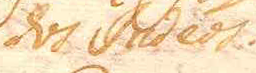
dos Iudeos.
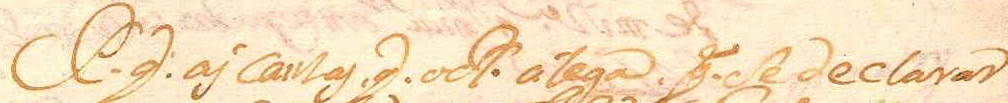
P. q̄. as cauzas, q̄. o R. alega. p.a se declarar
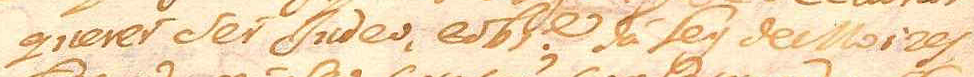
querer ser Judeo, e obs.e da Ley de Moizes
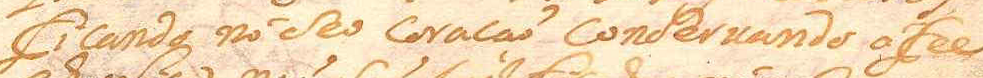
ficando nó seo coraçaõ conseruando a fee
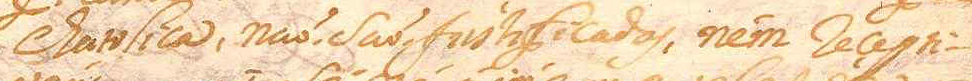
chatolica, naõ saõ Justificadas, nem Recepti
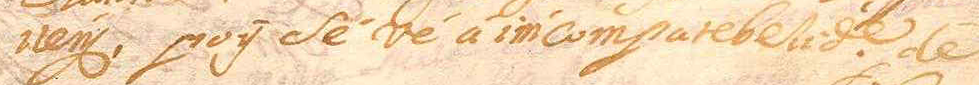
uens; pois se vé a imcompatebelid.e de
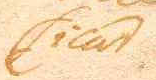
ficar
